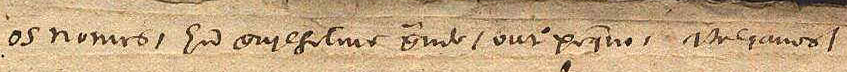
os nomes / hū gujlhelme ḡnde / outo peq̄no / Italjanos /
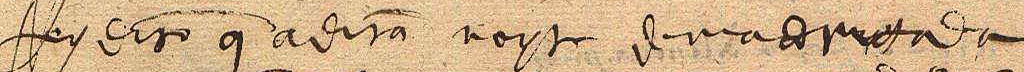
ffoy dito q̄ a dita noyte de madrugada
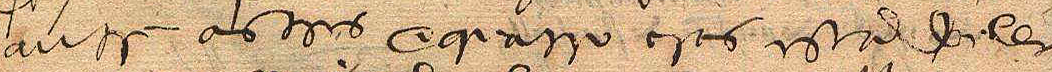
antre as tres e quatro oras estādo elle
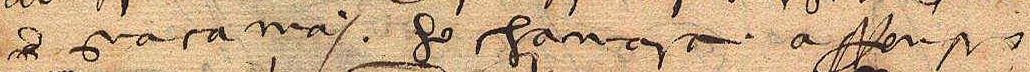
ē sua cama./. ho chamara affonsso
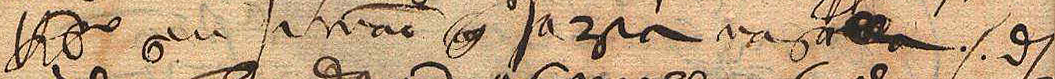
Ribro seu Jrmão q̄ Jazia na salla ./. dj
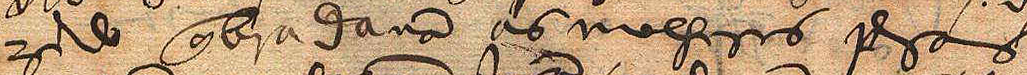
zēdo q̄ bradauā as molheres p̄sas
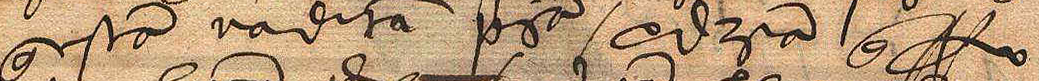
q̄ estā na dita p̄sā / e deziā q̄ ffo
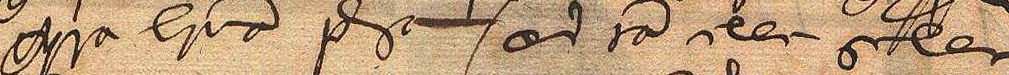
gyra huā p̄sa / e ētā elle se lle
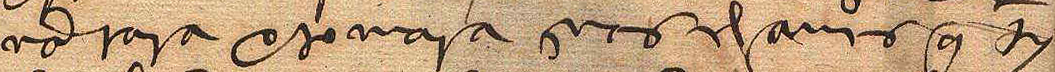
uātara e tomar suas chaues q̄ ty
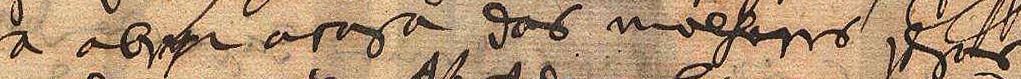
ra abryr a casa das molheres p̄sas
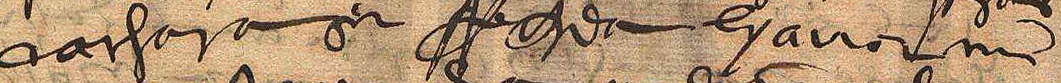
e achara ser ffogyda lyanor mē
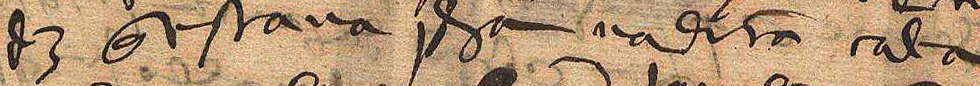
dez q̄ estaua p̄sa na dita cadea
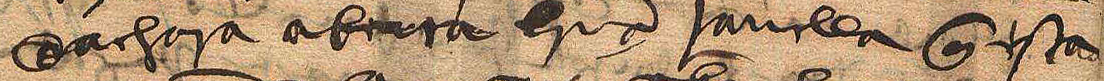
e achara aberta huā Janella q̄ esta
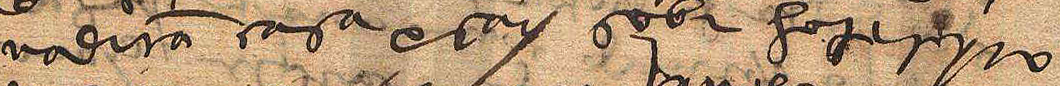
na dita casa e cay sob̄r ho tereyro
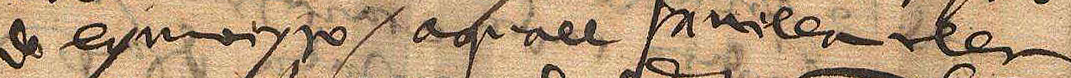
do lymoeyro / a quall Janella elle
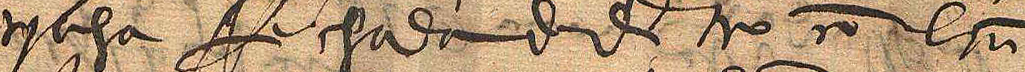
tynha ffechada de dētro com hū
